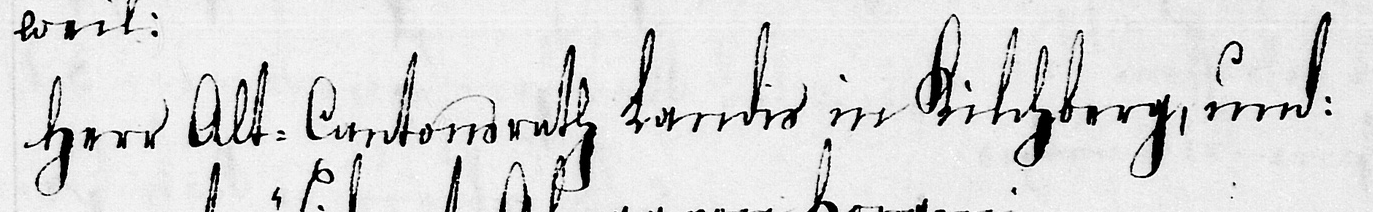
Herr Alt-Cantonsrath Landis in Kilchberg, und:
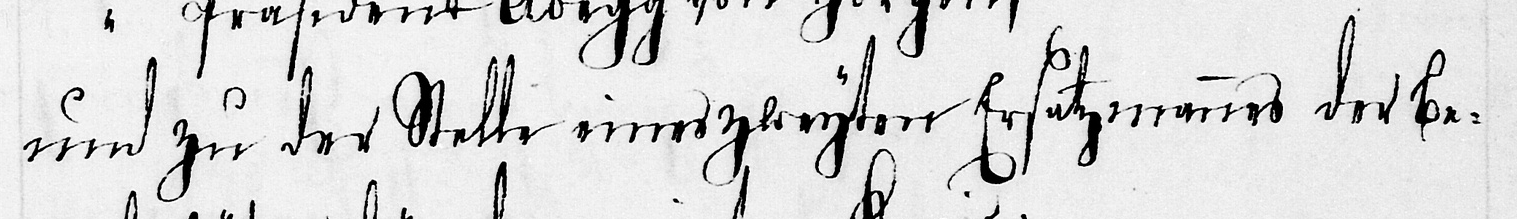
und zu der Stelle eines zweyten Ersatzmannes der Be¬
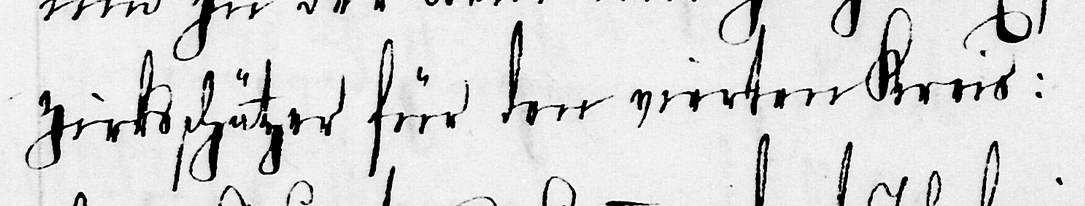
zirksschätzer für den vierten Kreis:
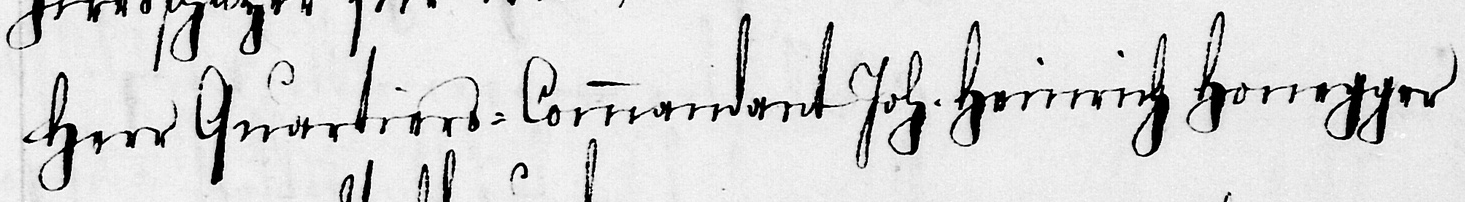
Herr Quartiers-Commandant Joh. Heinrich Honegger
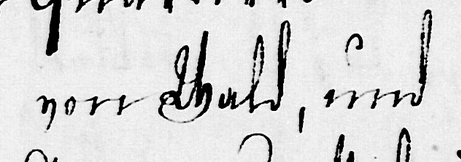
von Wald, und
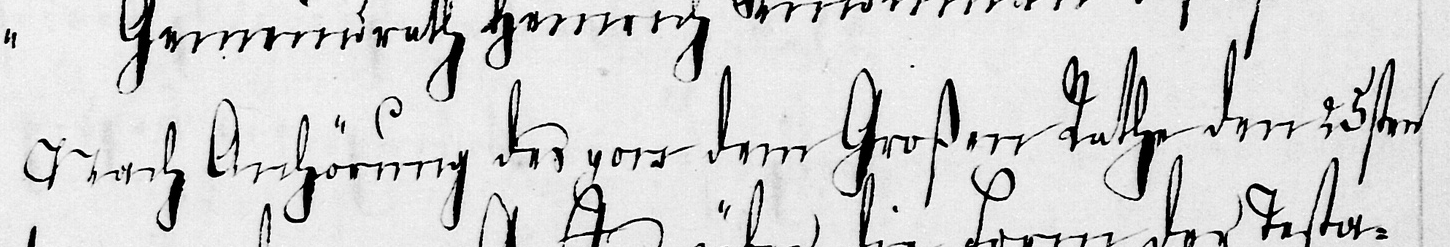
Nach Anhörung des von dem Großen Rathe den 25sten
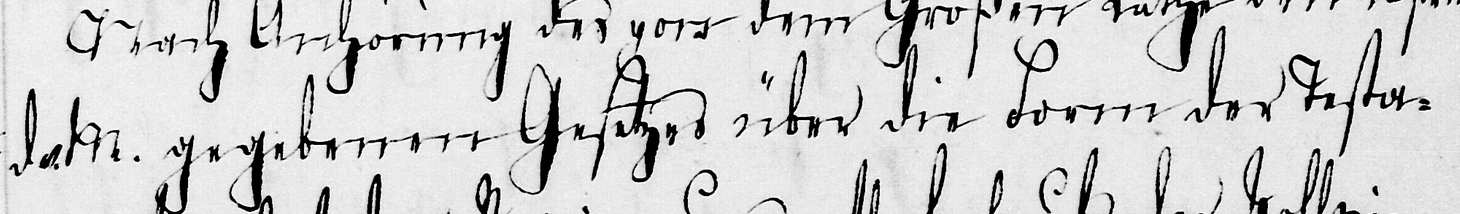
ds. M. gegebenen Gesetzes über die Form der Testa¬
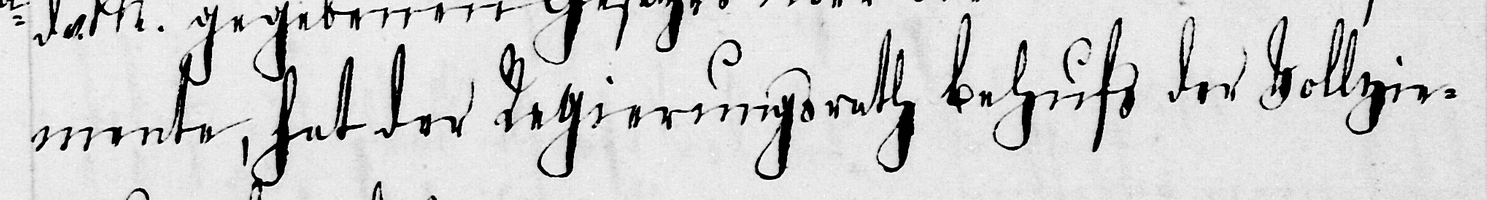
mente, hat der Regierungsrath behufs der Vollzie¬
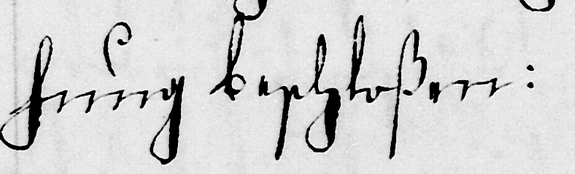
hung beschloßen:
